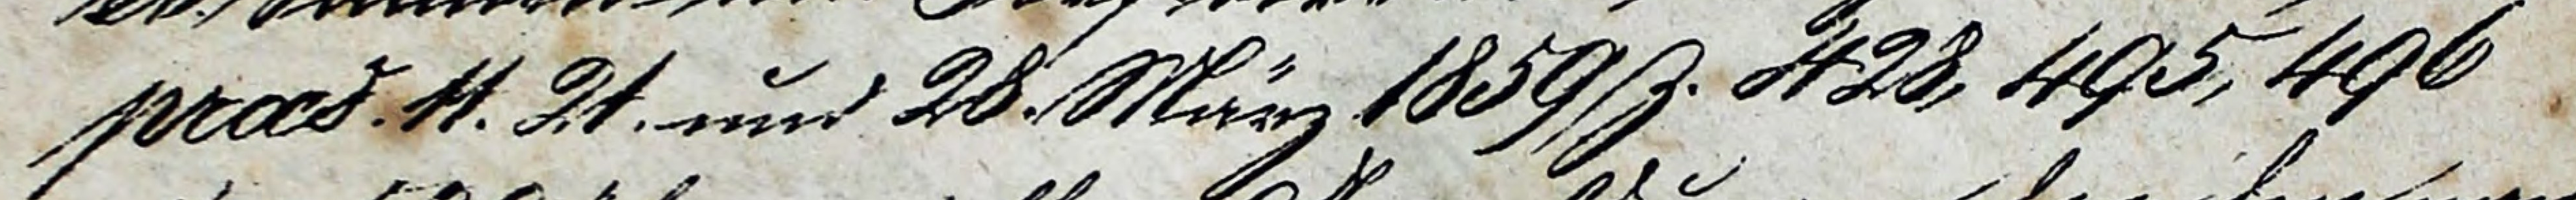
pras. 11. 21. und 28. März 1859 Z. 428, 495, 496
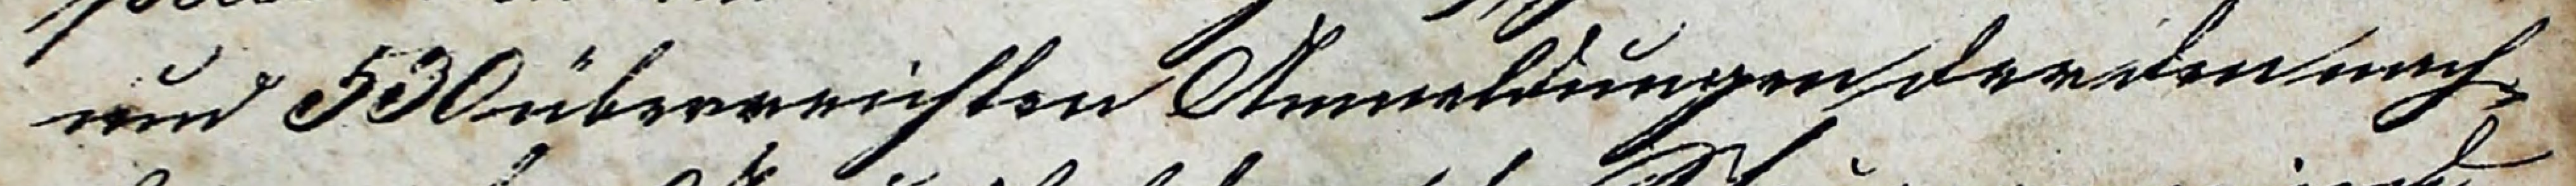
und 530 überreichten Anmeldungen der den nach
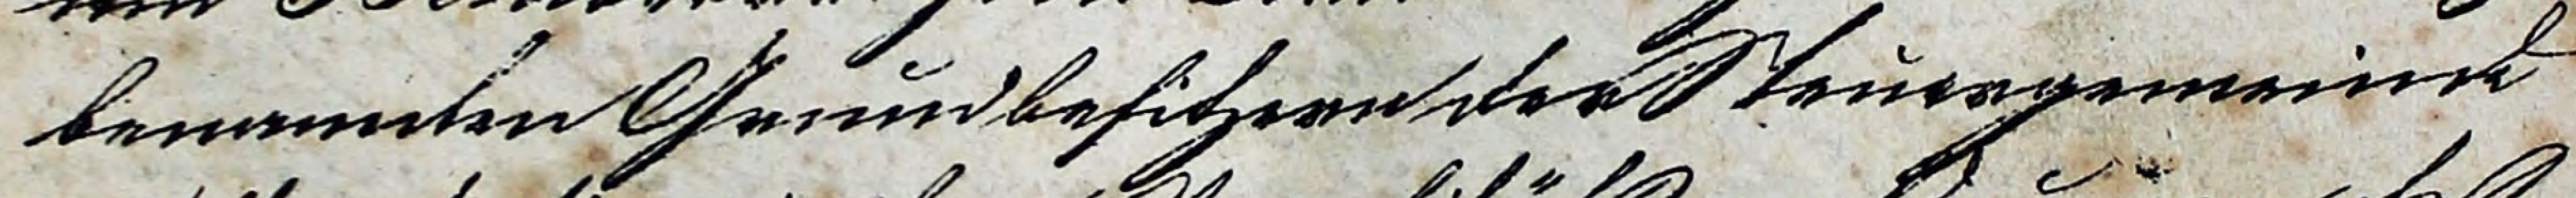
bekannten Grundbesitzern der Steuergemeinde
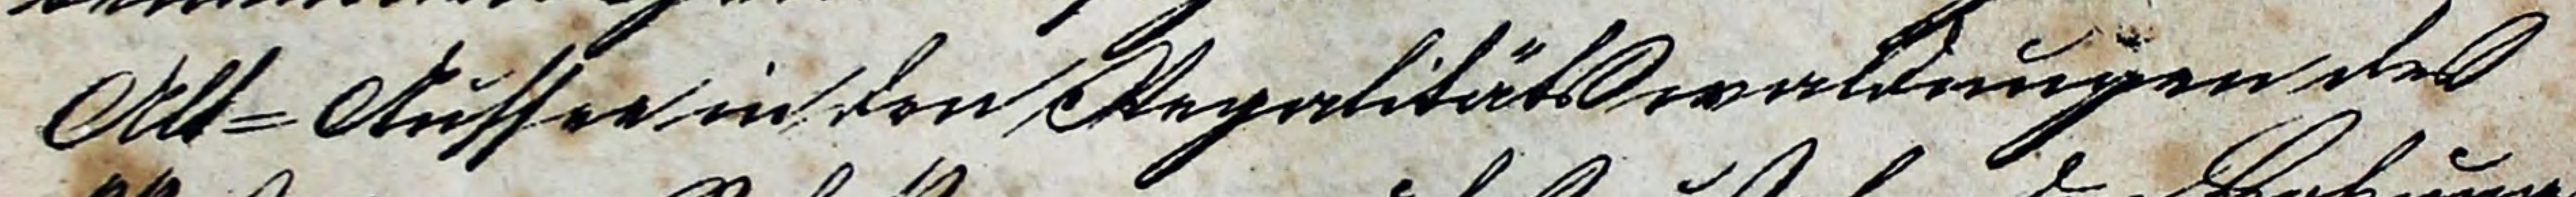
Alt=Aussee in den Regalitätswaldungen des
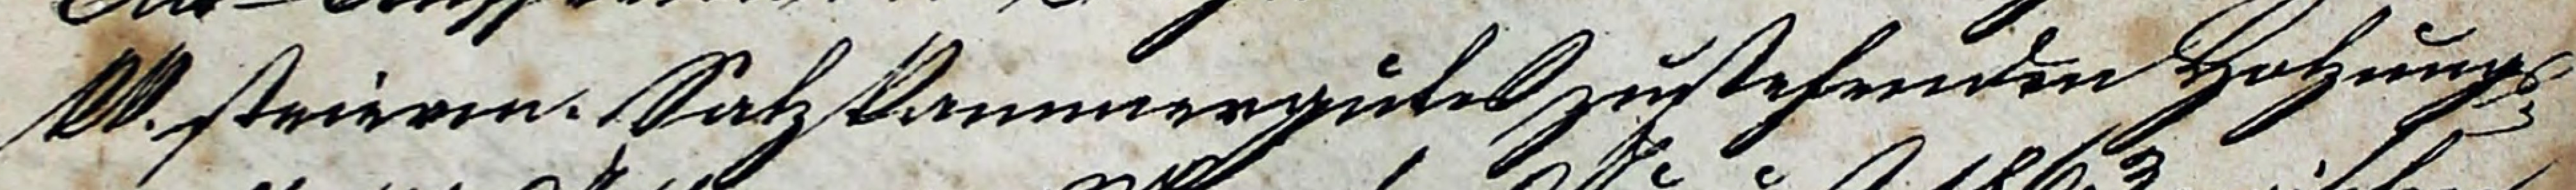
kk. steierm. Salzkammergutes zustehenden Holzungs„
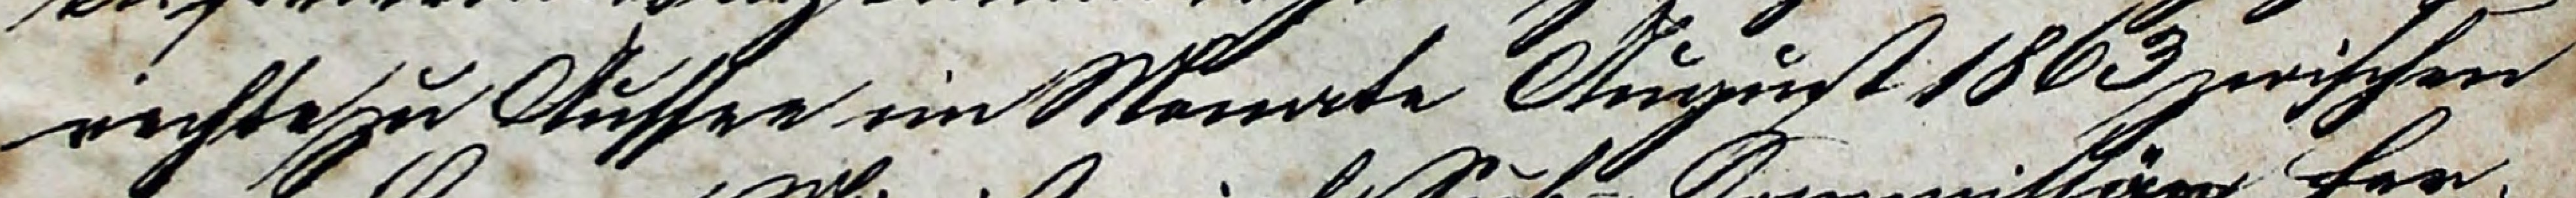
rechte zu Aussee im Monate August 1863 zwischen
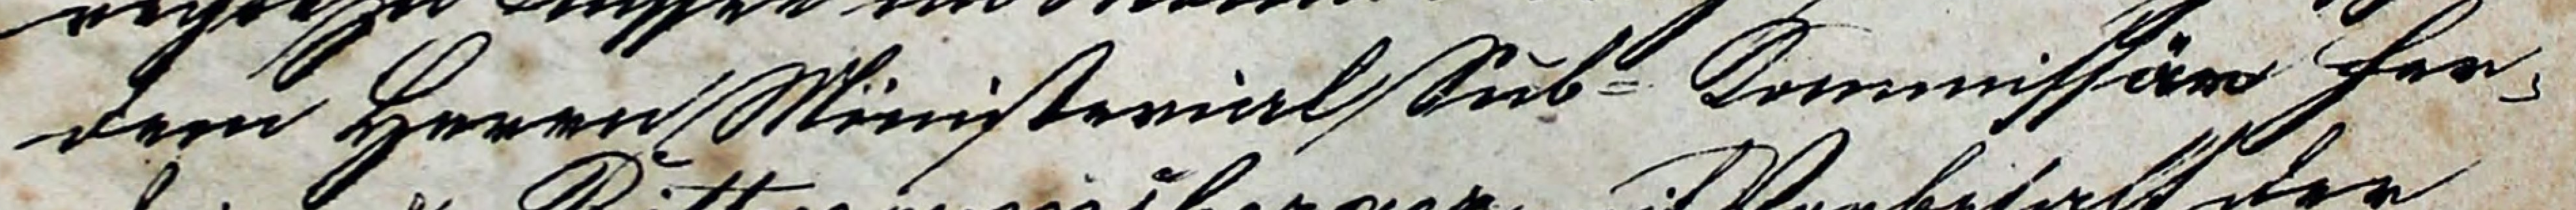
dem Herrn Ministerial Sub= Kommissär Fer„
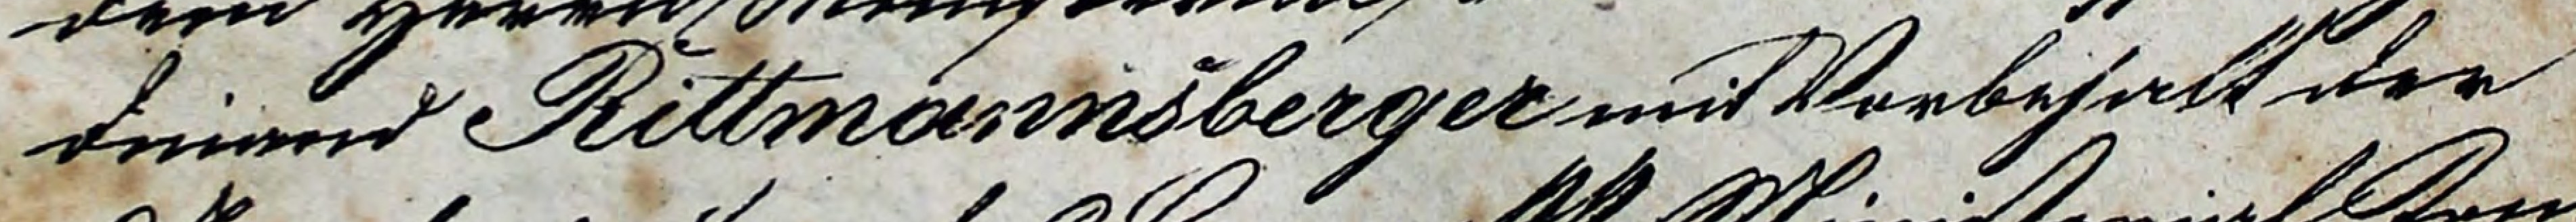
dinand Rittmannsberger mit Vorbehalt der
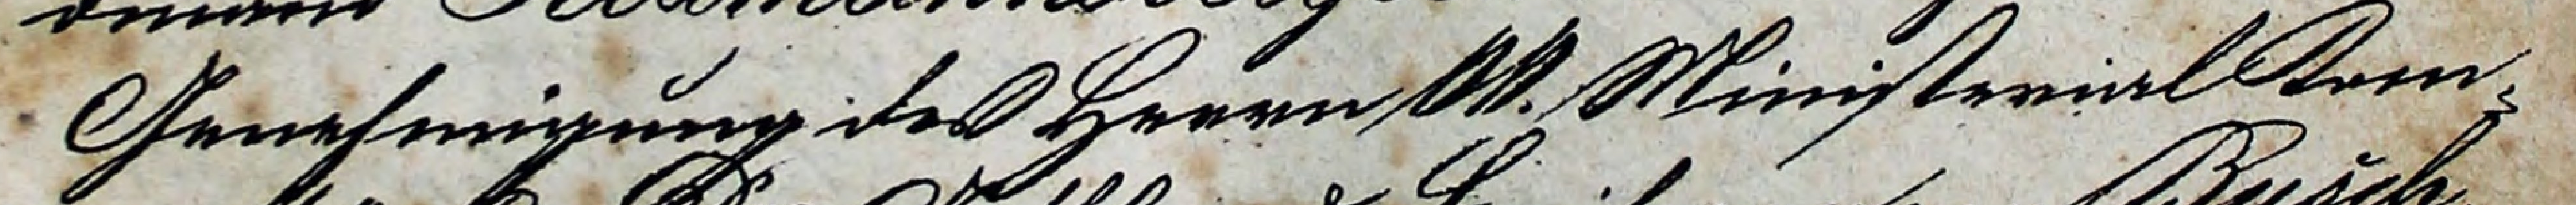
Genehmigung des Herrn kk. Ministerial Kom„
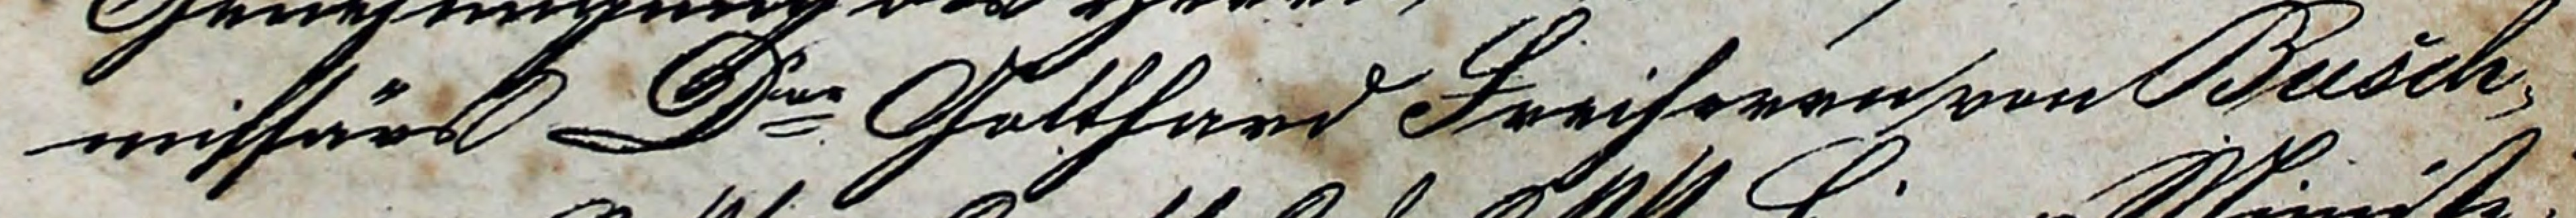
missärs D?? Gotthard Freiherrn von Busch„
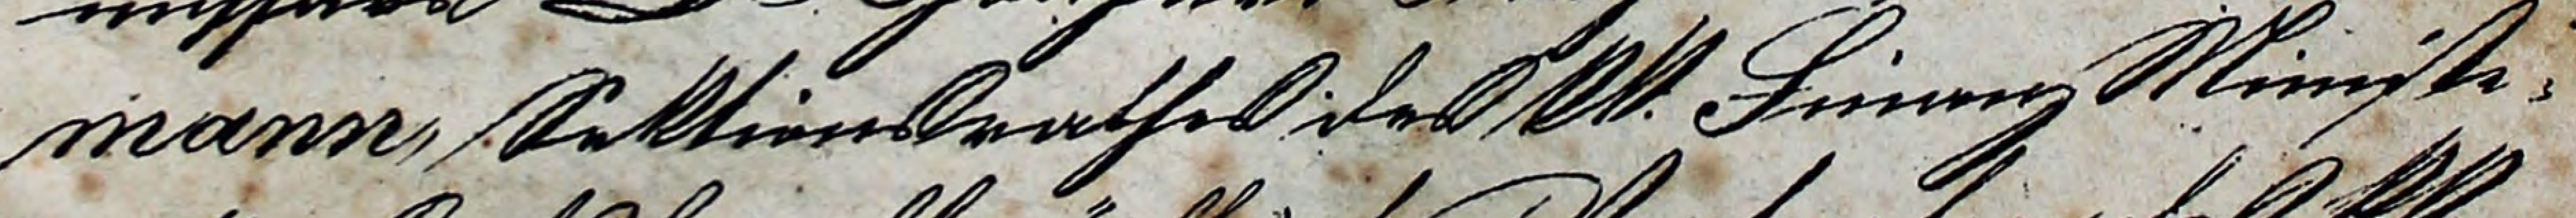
mann, Sektionsrathes des kk. Finanz Ministe„
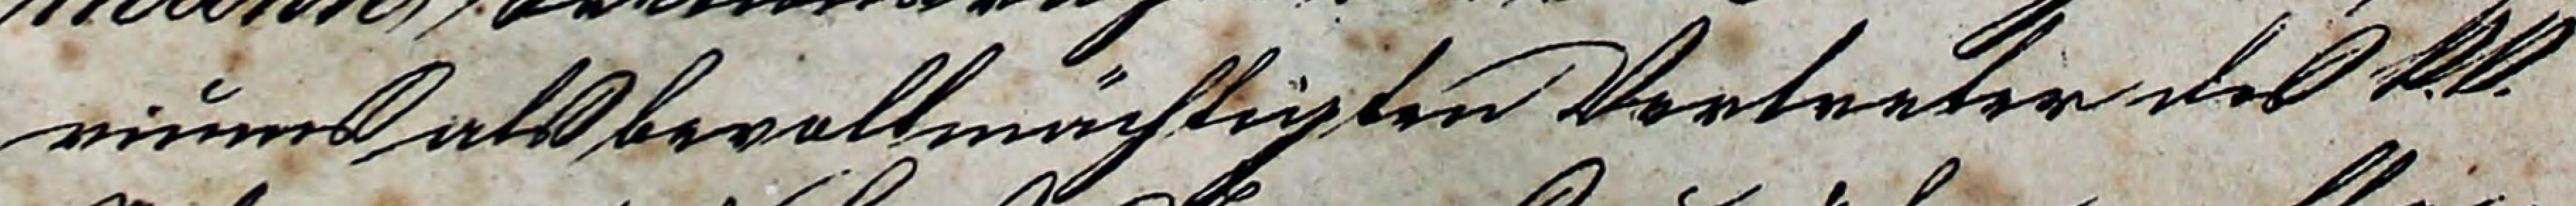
riums als bevollmächtigten Vortreter des k.k.
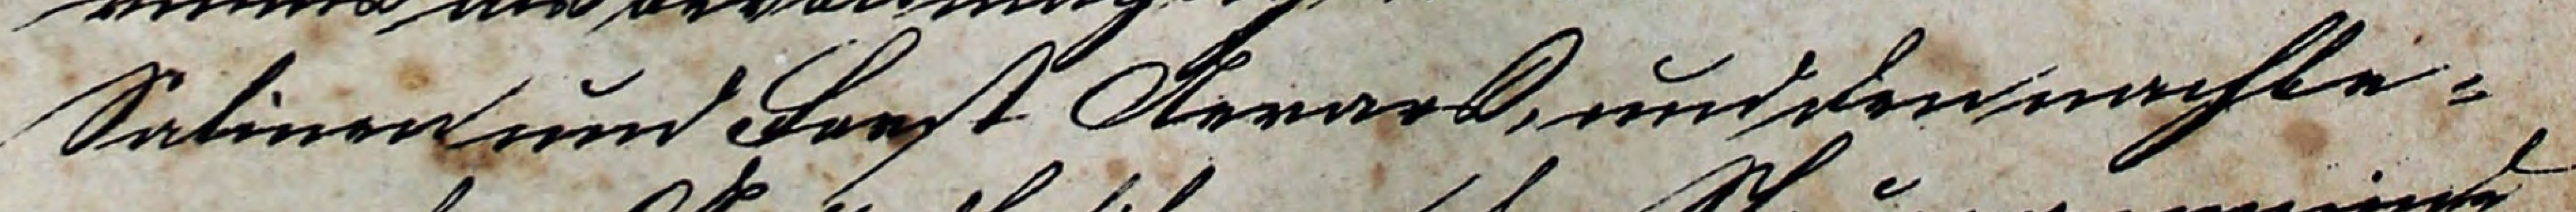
Salinen und Forst Aerars, und den machbe=
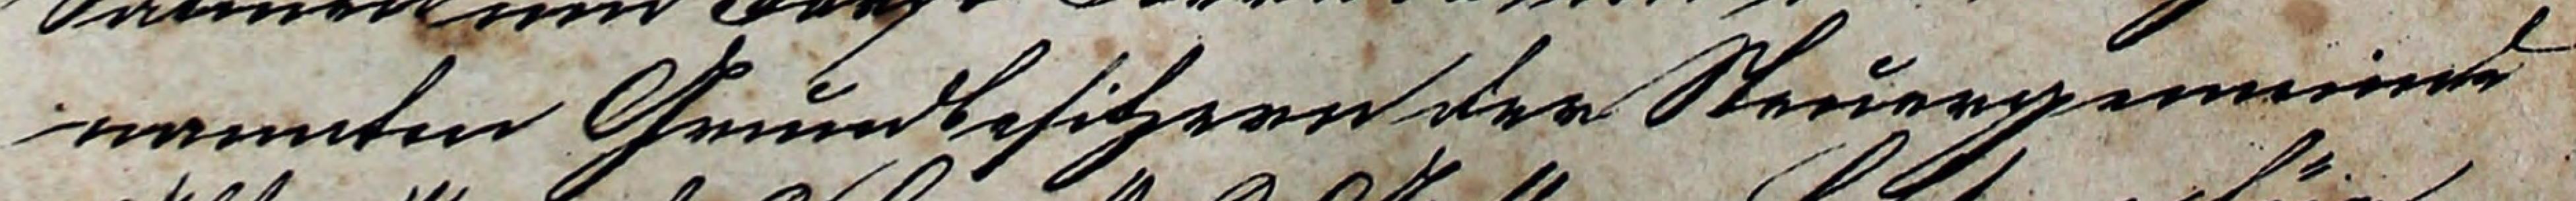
nannten Grundbesitzern der Steuergemeinde
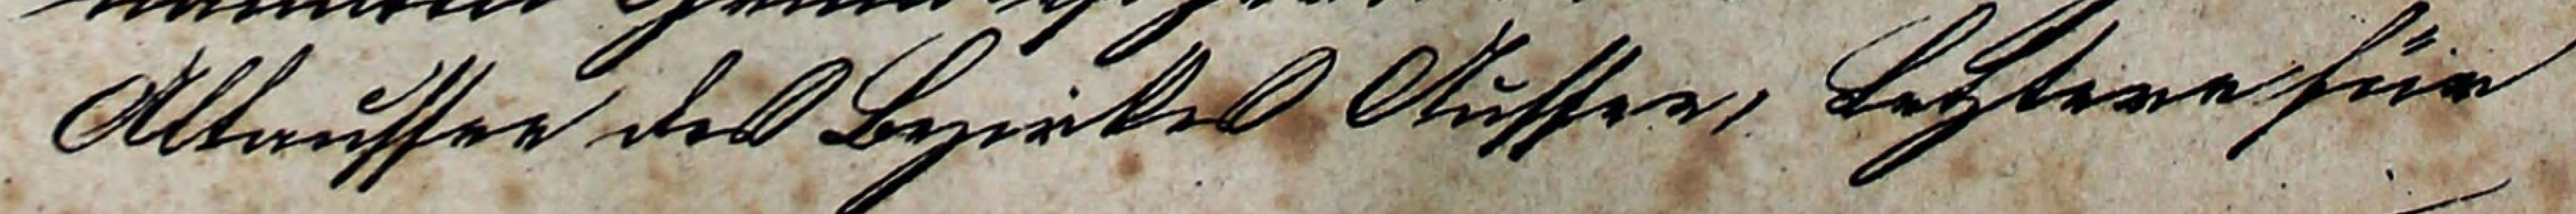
Altaussee des Bezirkes Aussee, Letztere für
